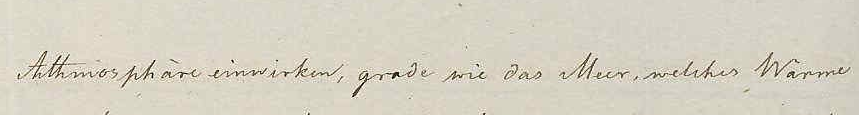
Athmosphäre einwirken, grade wie das Meer, welches Wärme
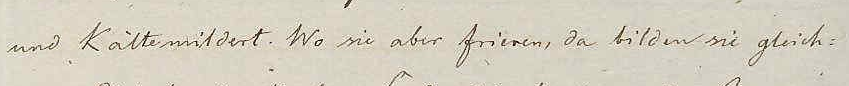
und Kälte mildert. Wo sie aber frieren, da bilden sie gleich-
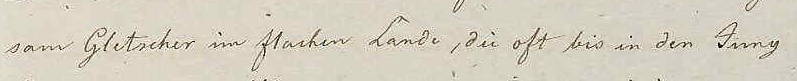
sam Gletscher im flachen Lande, die oft bis in den Juny
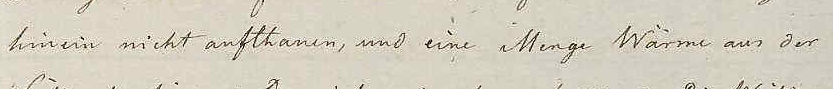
hinein nicht aufthauen, und eine Menge Wärme aus der
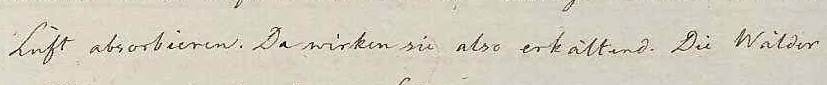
Luft absorbieren. Da wirken sie also erkältend. Die Wälder
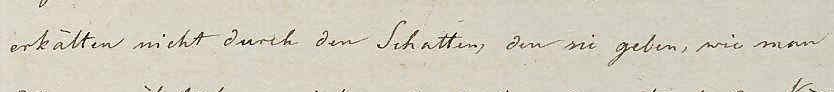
erkälten nicht durch den Schatten, den sie geben, wie man
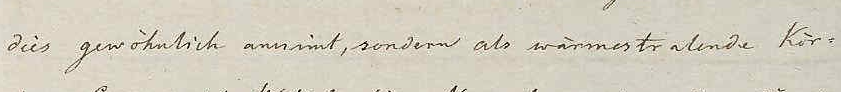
dies gewöhnlich annimt, sondern als wärmestralende Kör-
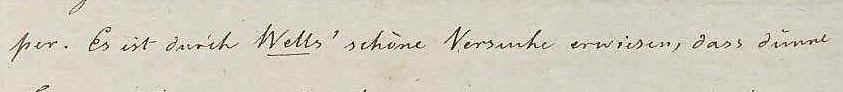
per. Es ist durch Wells' schöne Versuche erwiesen, dass dünne
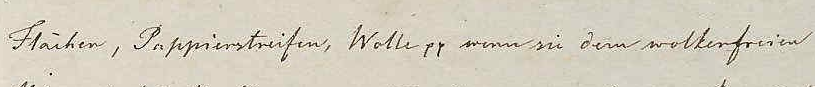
Flächen, Pappierstreifen, Wolle pp wenn sie dem wolkenfreien
